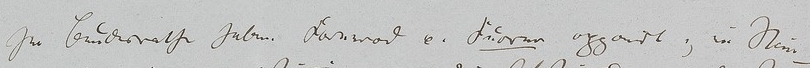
Im Bundesrathe haben Fornerod &. Furrer opponirt; im Stän-
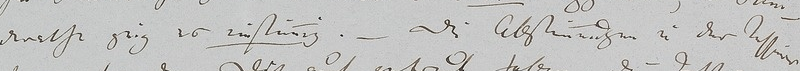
derathe ging es einstimmig. – Die Abstimmungen in der Tessiner
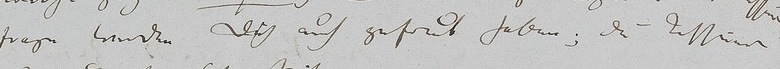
frage werden Dich auch gefreut haben; die Tessiner
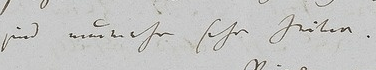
sind nunmehr sehr heiter.
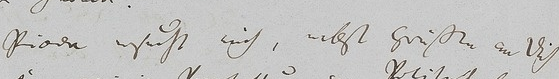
Pioda ersucht mich, nebst Grüßen an Dich
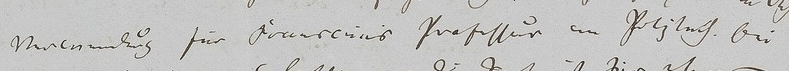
Verwendung für Franscinis Professur am Polytech. bei
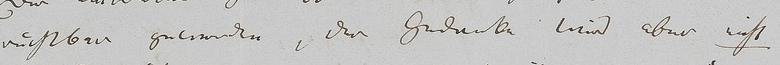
ruchtbar geworden, der Gedanke wird aber nicht
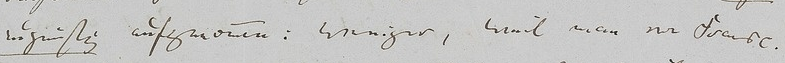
ungünstig aufgenommen: weniger, weil man von Fransc.
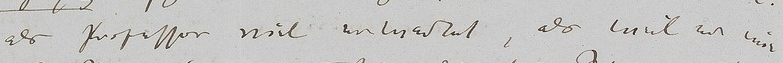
als Professor viel erwartet, als weil er eine
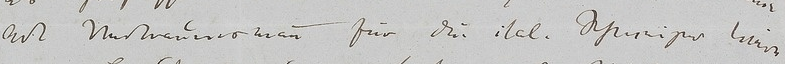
Art Vertrauensmann für die ital. Schweizer wäre,
